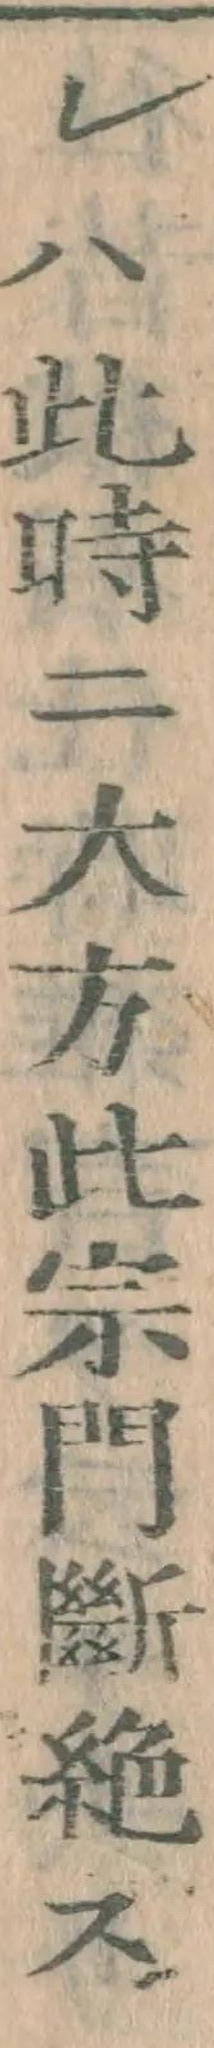レハ此時ニ大方此宗門断絶ス
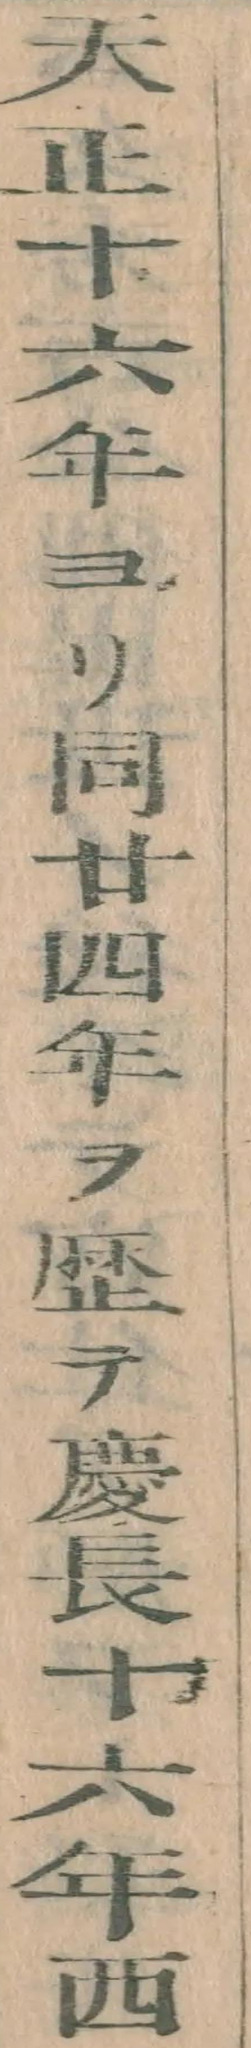天正十六年ヨリ同廿四年ヲ歴テ慶長十六年西
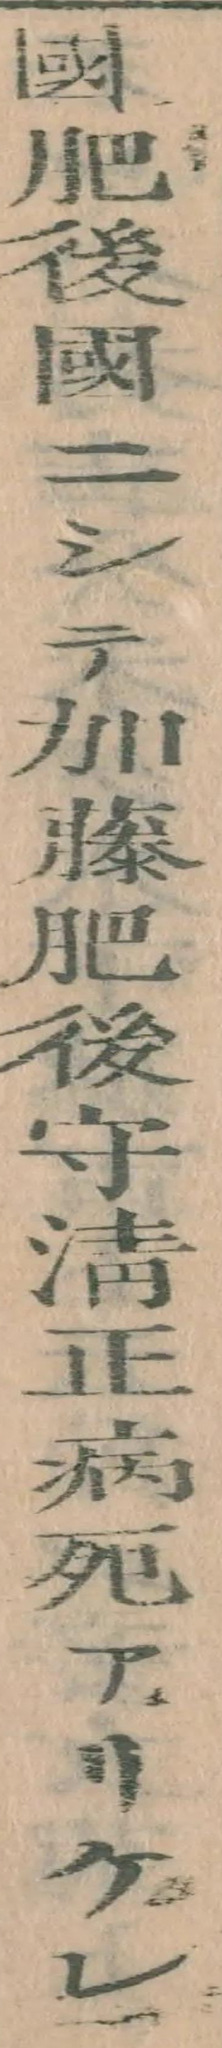国肥後国ニシテ加藤肥後守清正病死アリケレ
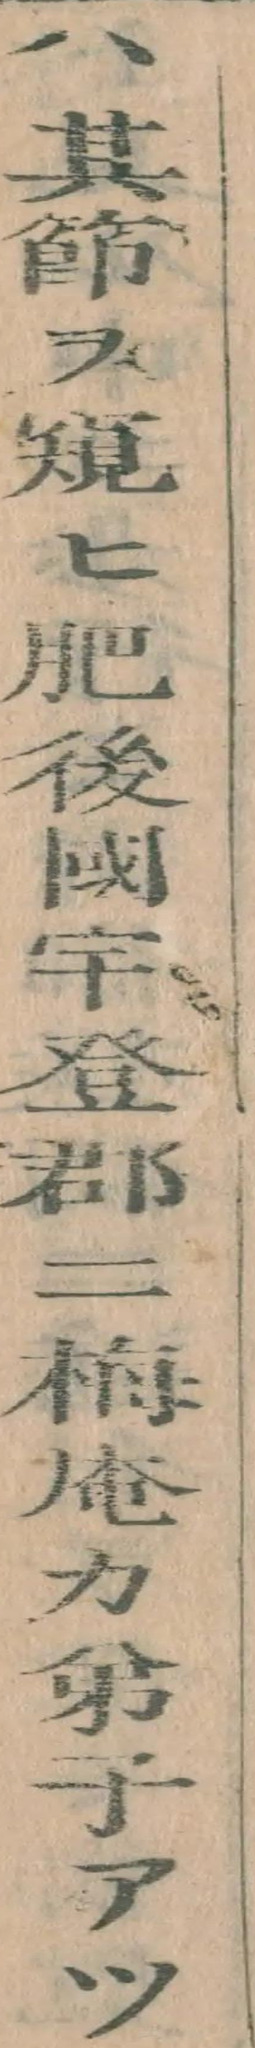ハ其節ヲ窺ヒ肥後国宇登郡ニ梅庵カ弟子アツ
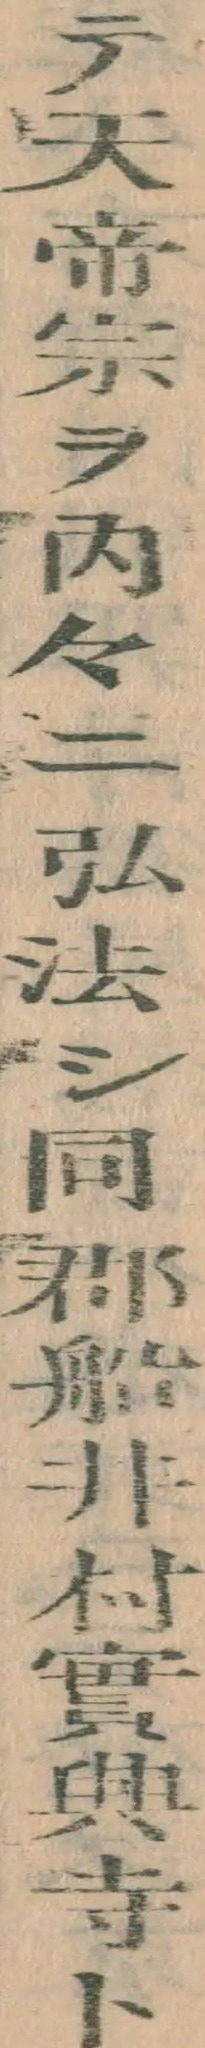テ天帝宗ヲ内々ニ弘法シ同郡船井村実興寺ト
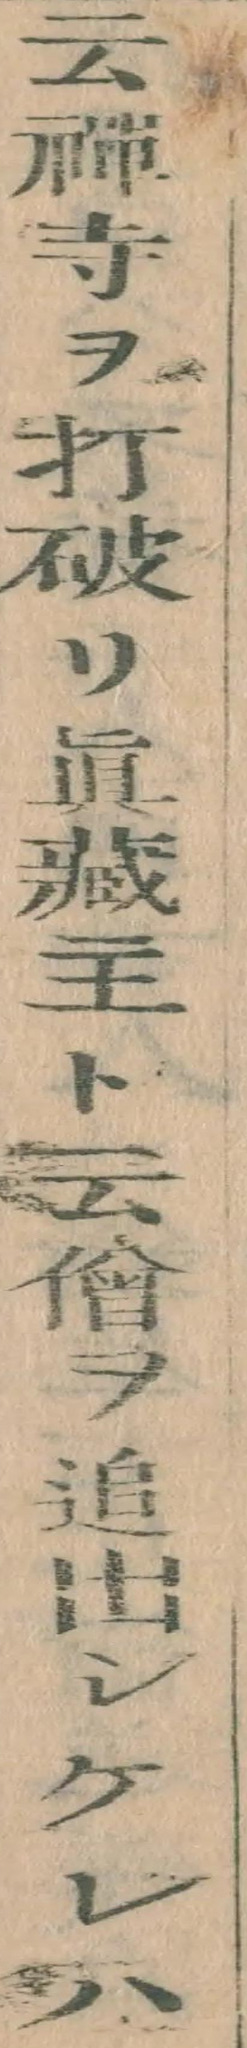云禅寺ヲ打破リ真蔵主ト云僧ヲ追出シケレハ
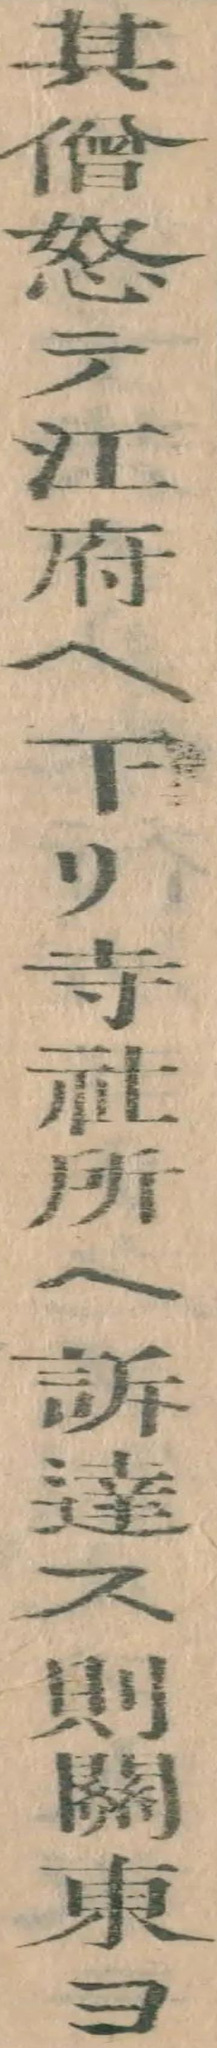其僧怒テ江府ヘ下リ寺社所ヘ訴達ス則関東ヨ
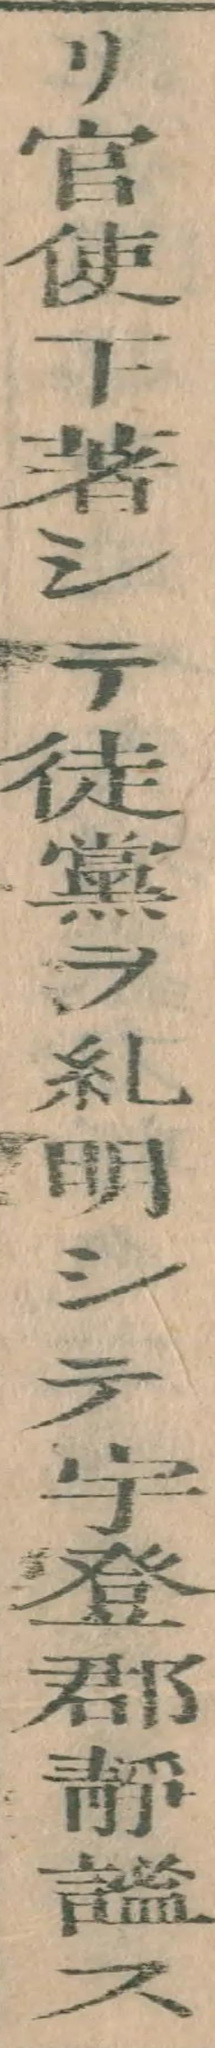リ官使下著シテ徒党ヲ糺明シテ宇登郡静謐ス
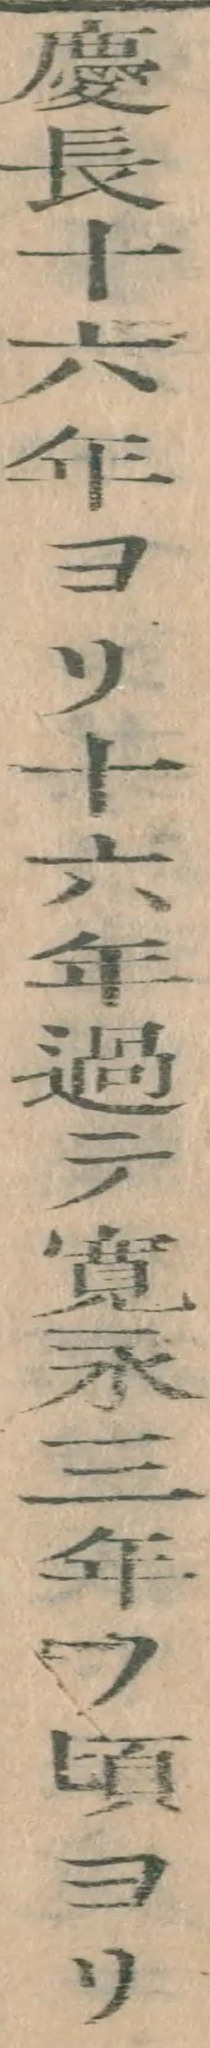慶長十六年ヨリ十六年過テ寛永三年ノ頃ヨリ
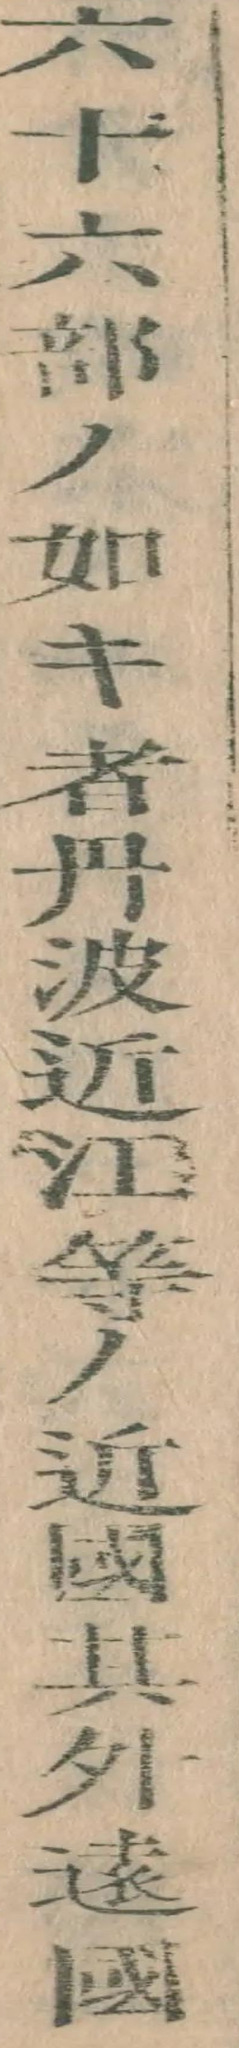六十六部ノ如キ者丹波近江等ノ近国其外遠国
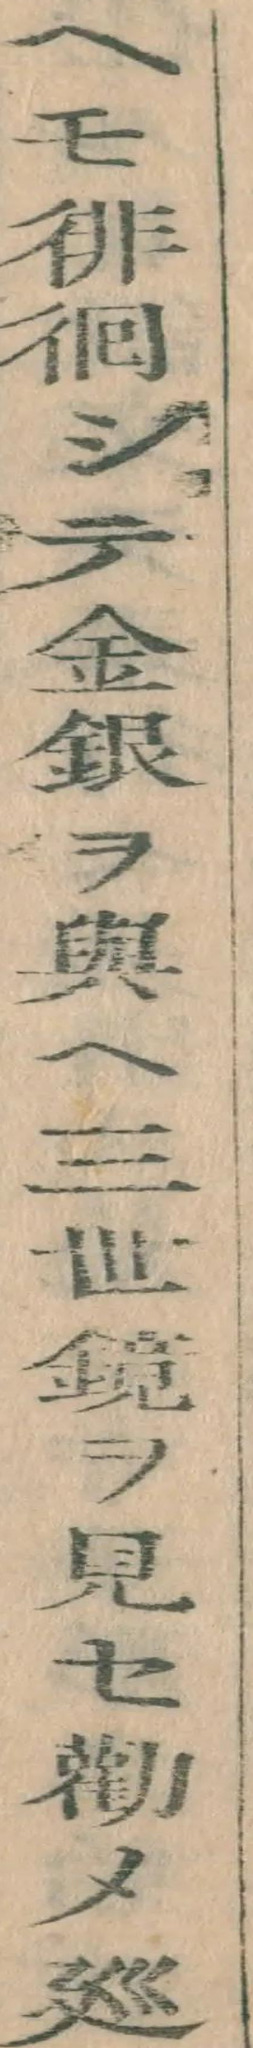ヘモ徘徊シテ金銀ヲ与ヘ三世鏡ヲ見セ勧メ巡
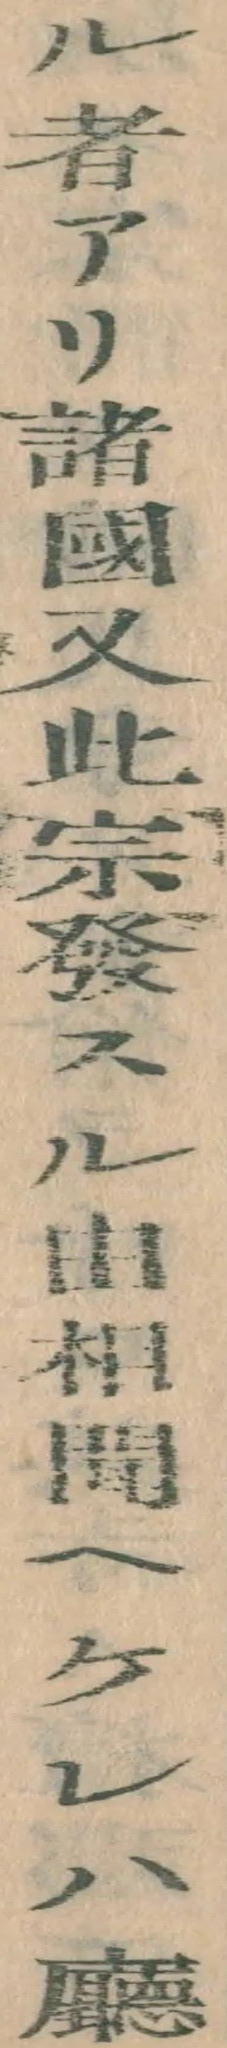ル者アリ諸国又此宗発スル由相聞ヘケレハ庁
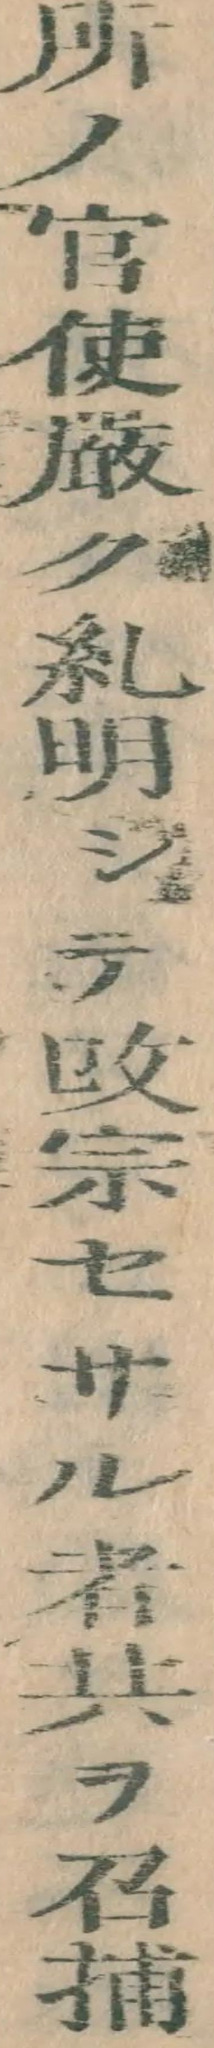所ノ官使厳ク糺明シテ改宗セサル者共ヲ召捕
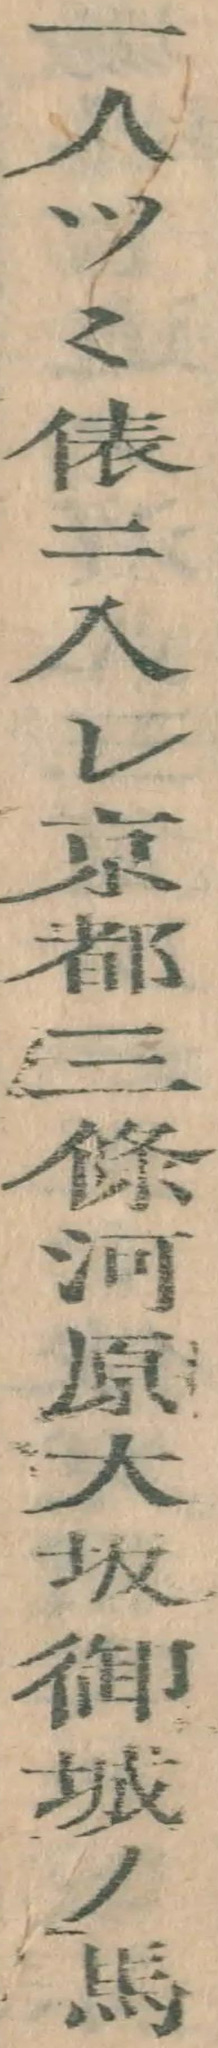一人ツ〱俵ニ入レ京都三条河原大坂御城ノ馬

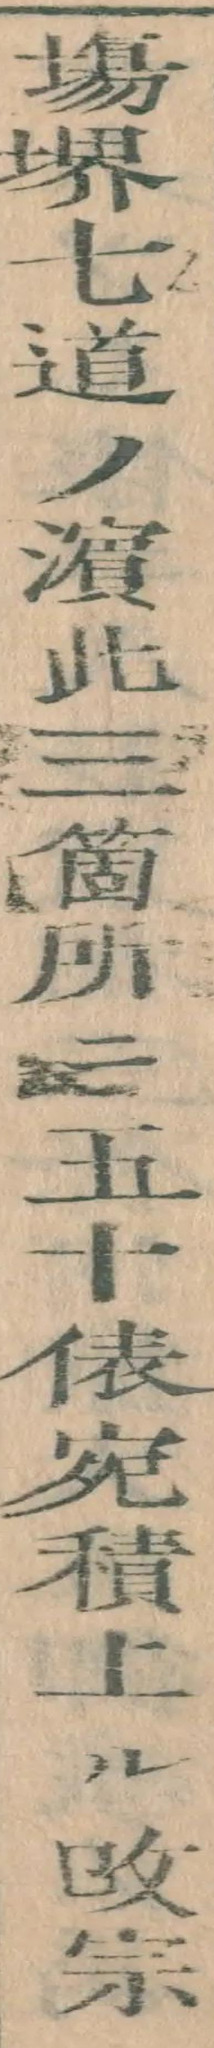場堺七道ノ浜此三箇所ニ五十俵宛積上ル改宗
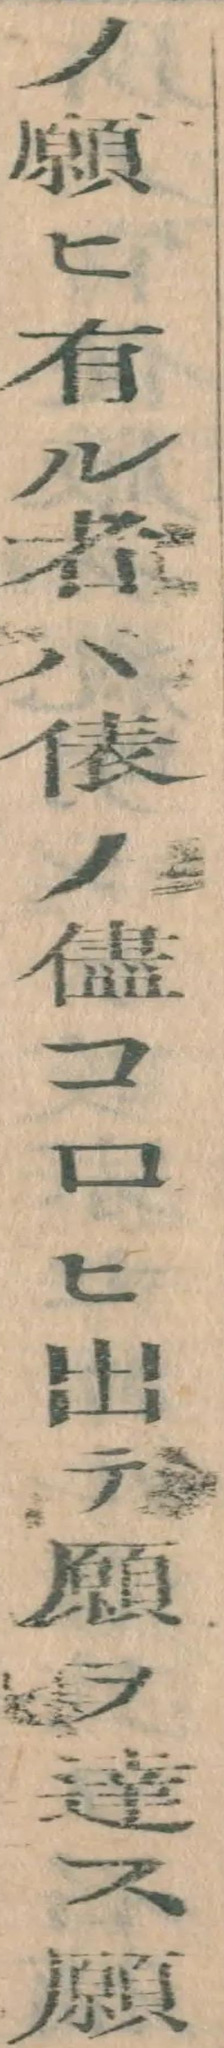ノ願ヒ有ル者ハ俵ノ儘コロヒ出テ願ヲ達ス願
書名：南蛮寺興廃記
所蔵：国立国会図書館 National Diet Library, JAPAN
